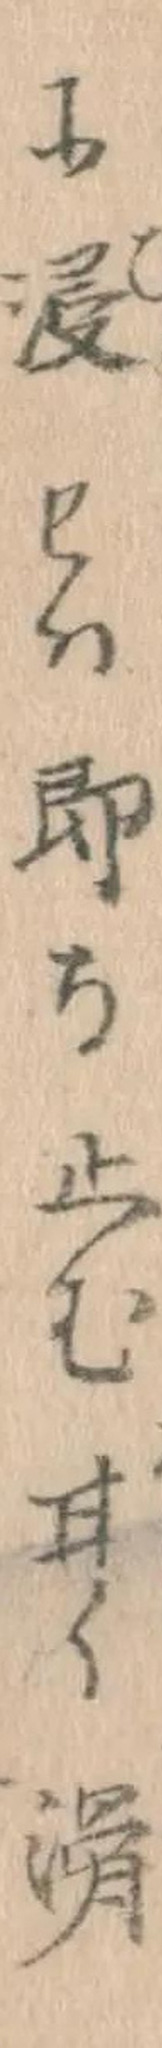に浸せは即ち止む甘く滑
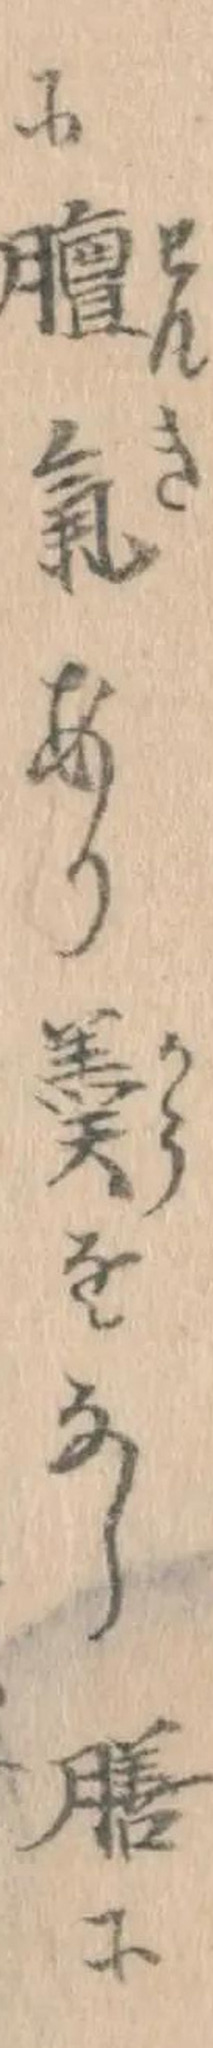に膻気あり羹をなし膳に
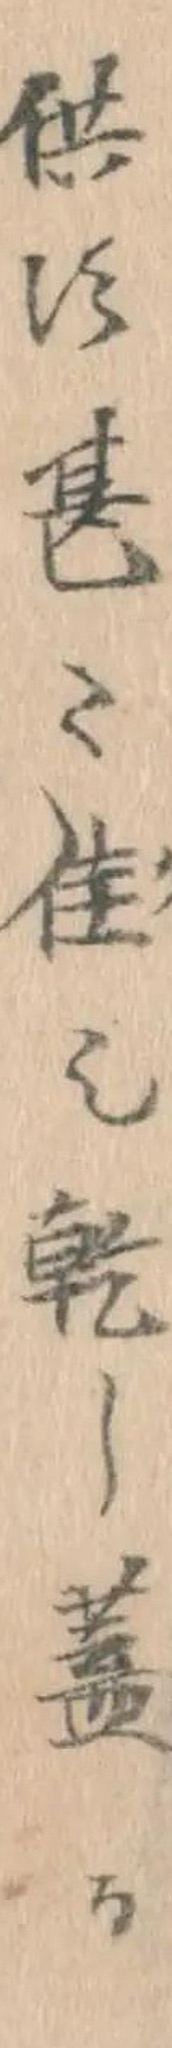供す甚た佳也乾し蓋る
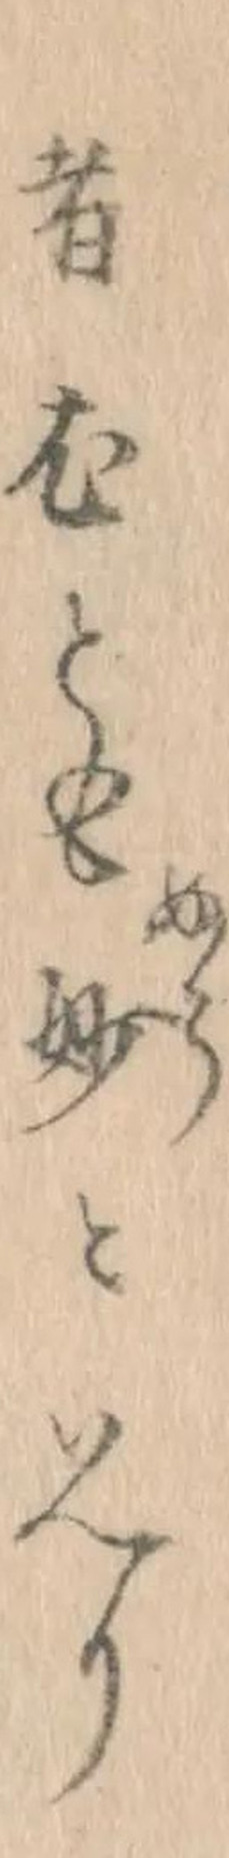者尤とも妙といへり

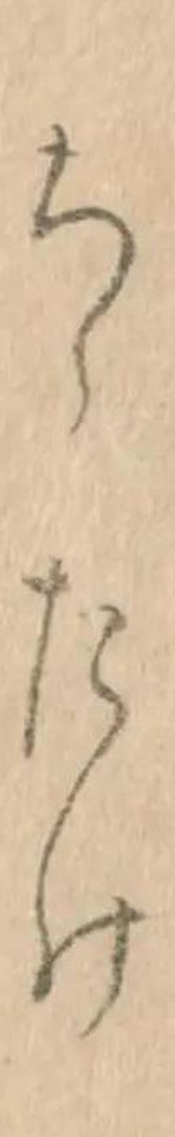ちゝたけ
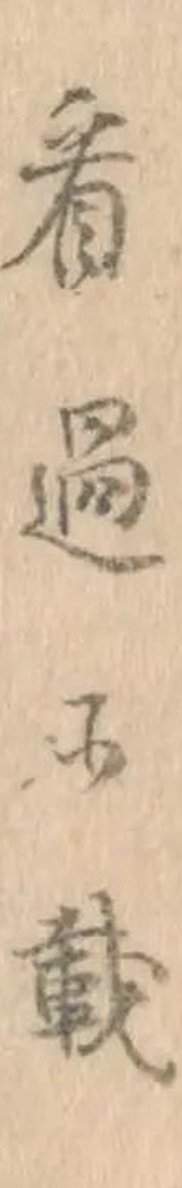看過に載
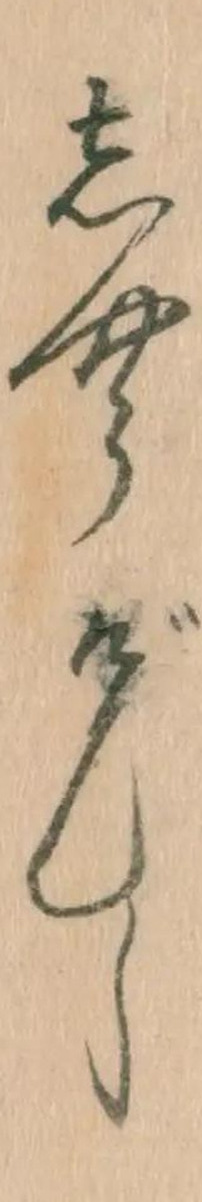しやうげんし
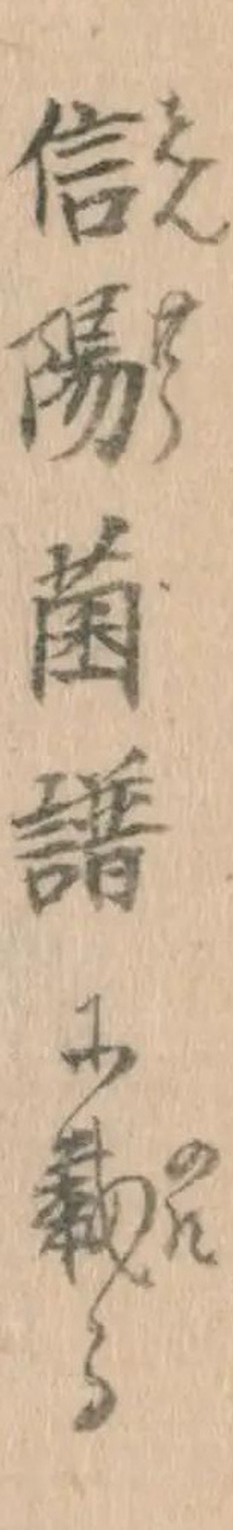信陽菌譜に載る
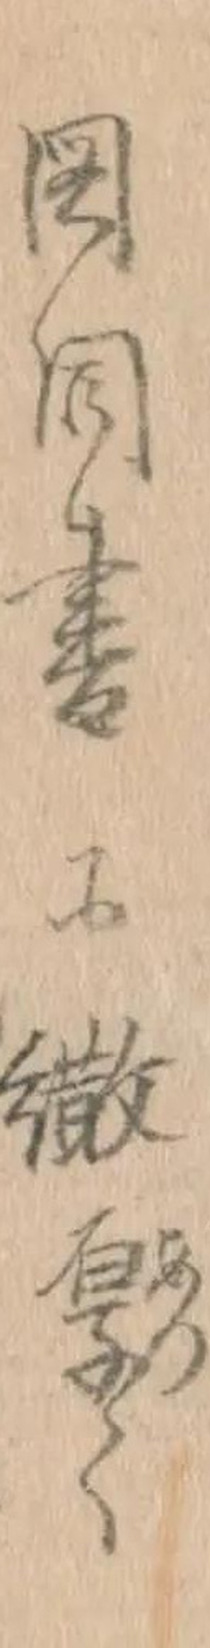図同書に繖厚く
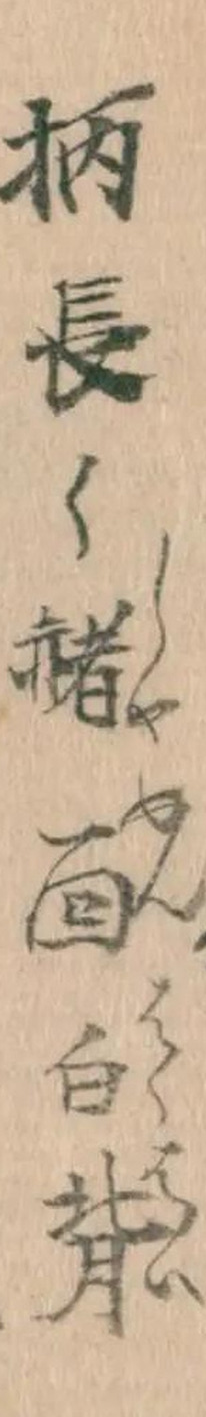柄長く赭面白背
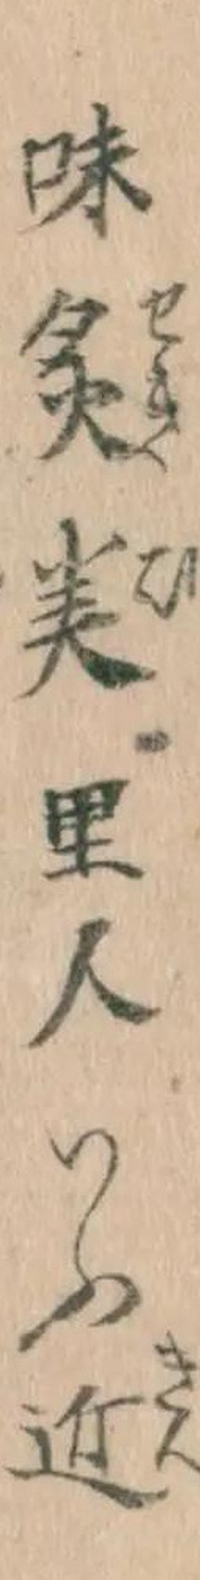味炙美里人いふ近
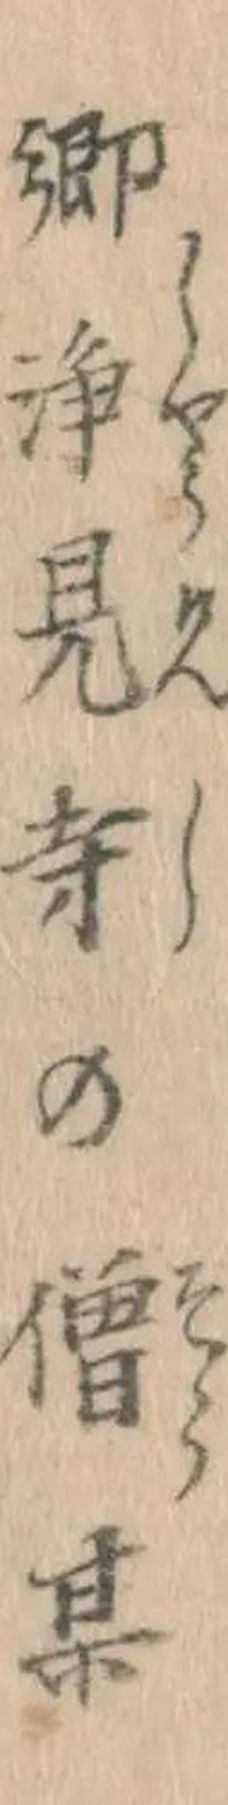郷浄見寺の僧某
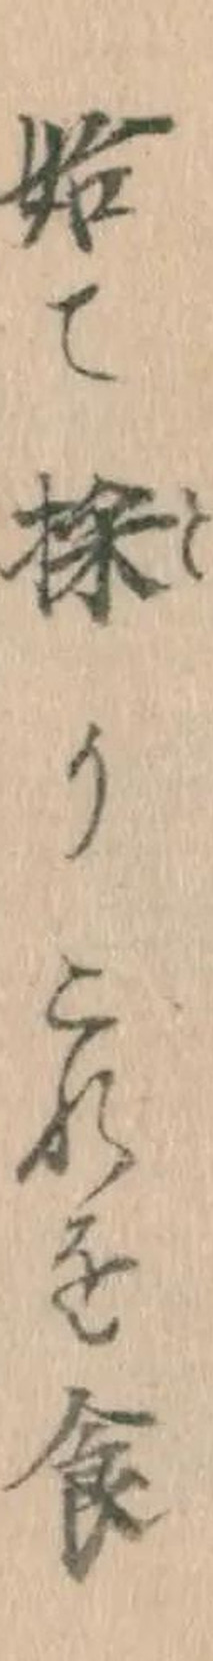始て採りこれを食
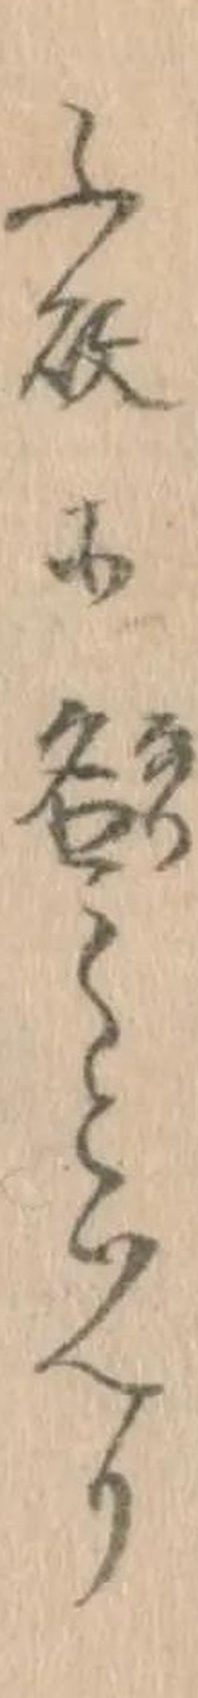ふ故に名くといへり
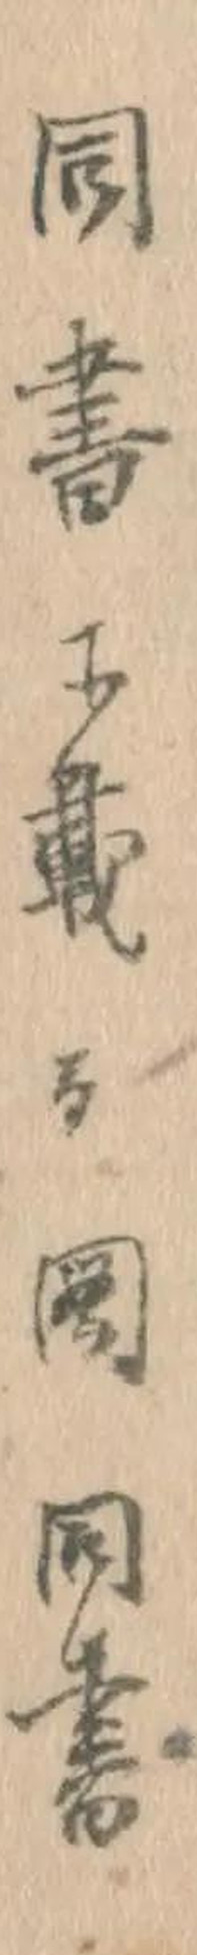同書に載る図同書
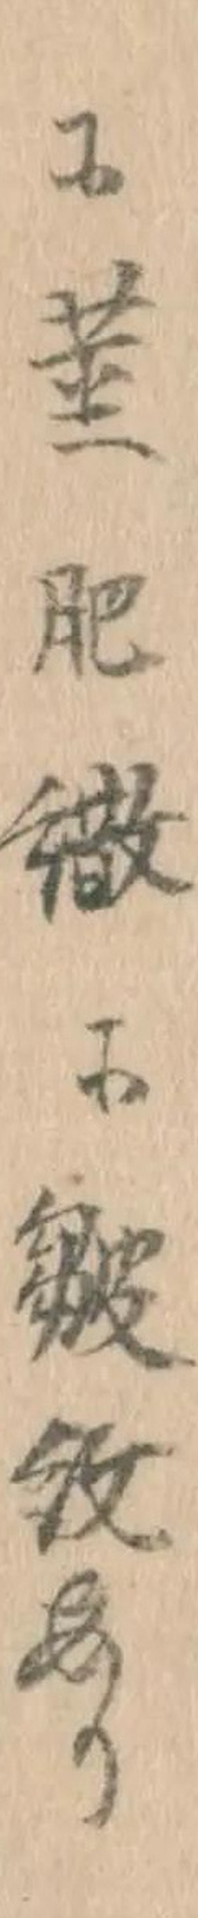に茎肥繖に皺紋あり
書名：本草図譜. 巻58-60
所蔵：国立国会図書館 National Diet Library, JAPAN
